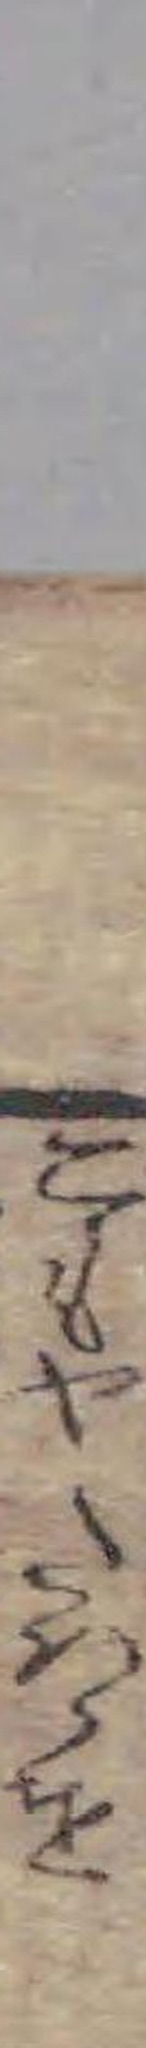こもやたはらを
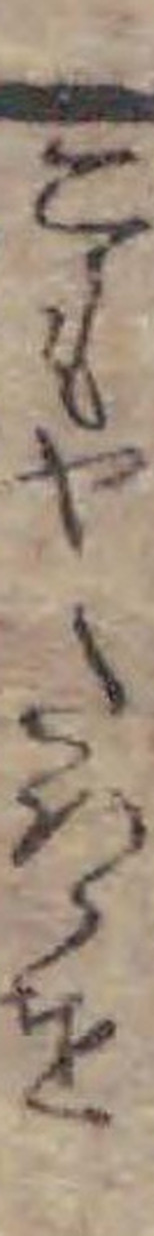こもやたはらを
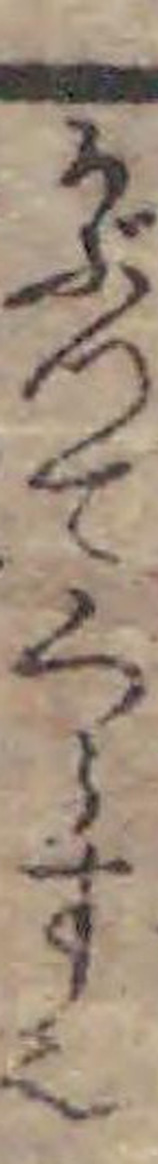かぶつてくらす也
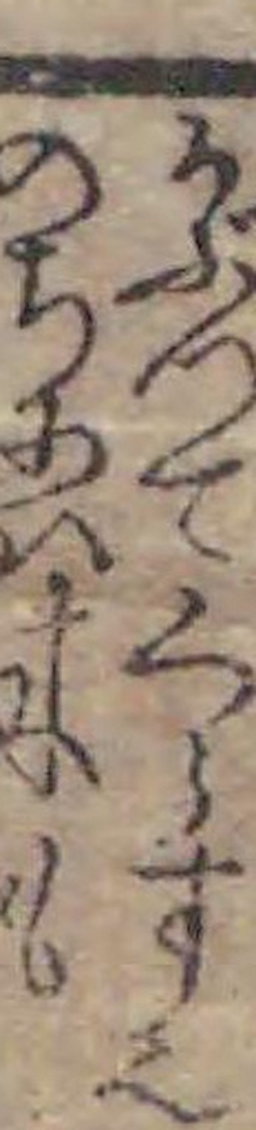のちには木も
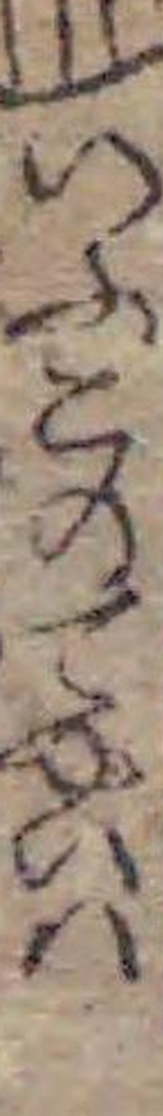いふこのてやいは
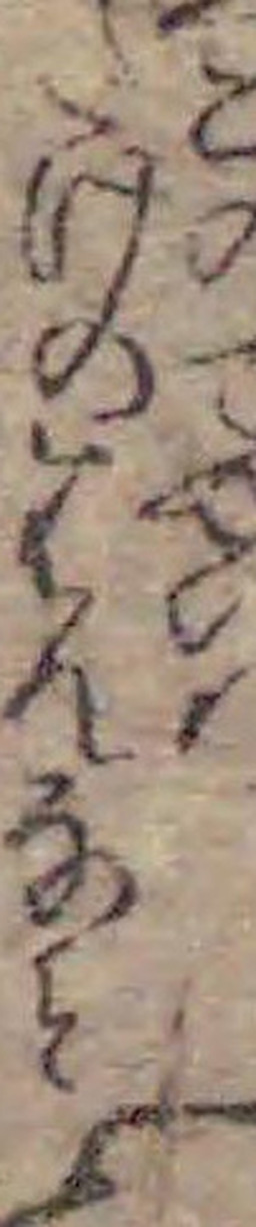はたけのはんなと
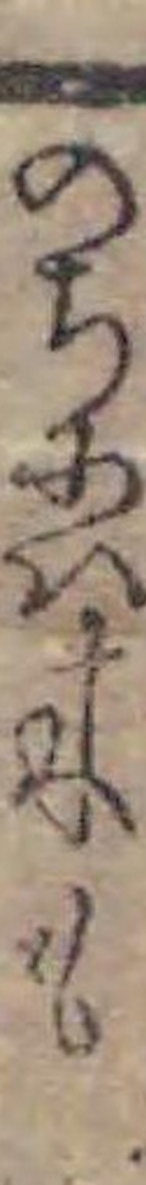のちには木も
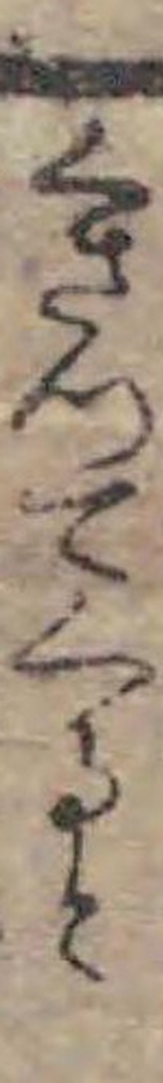くさつてくると
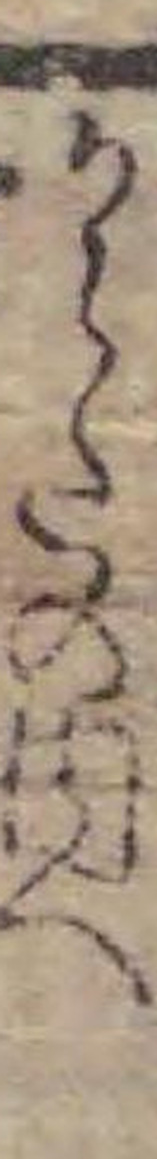からたの内へ
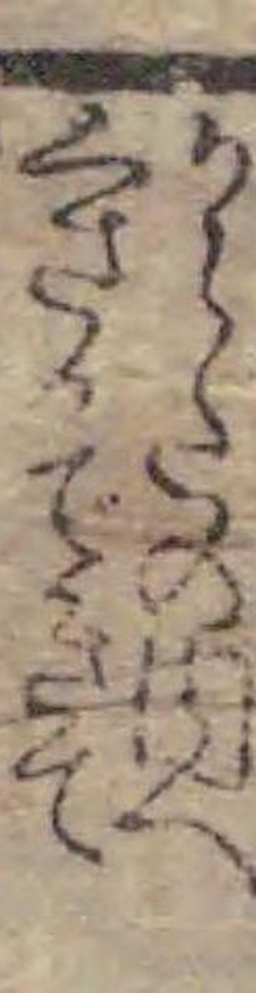くさかできて
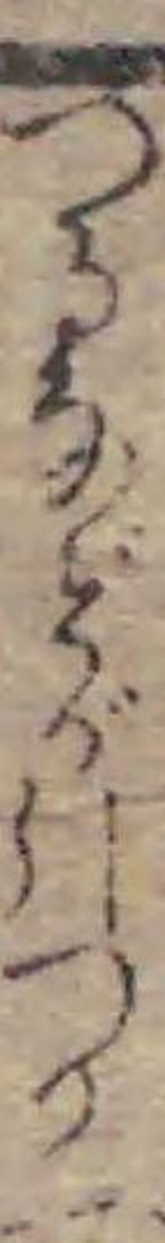つるなどが引つり
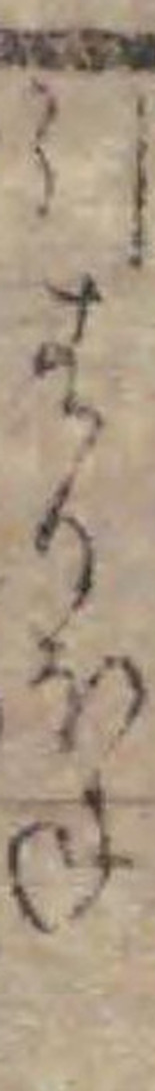引はりほね
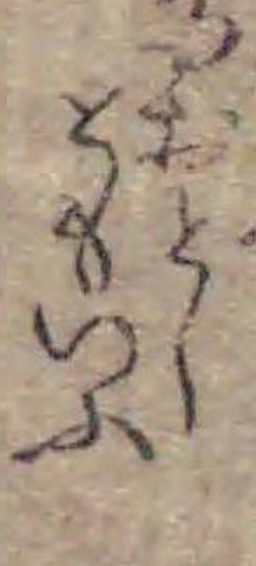ともいふ
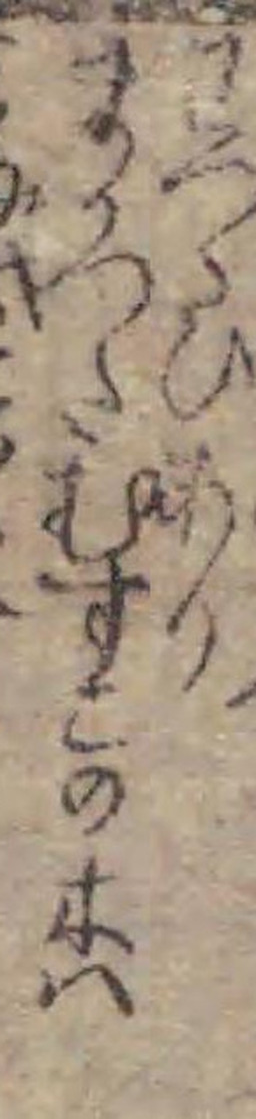まかつたむすこの木は
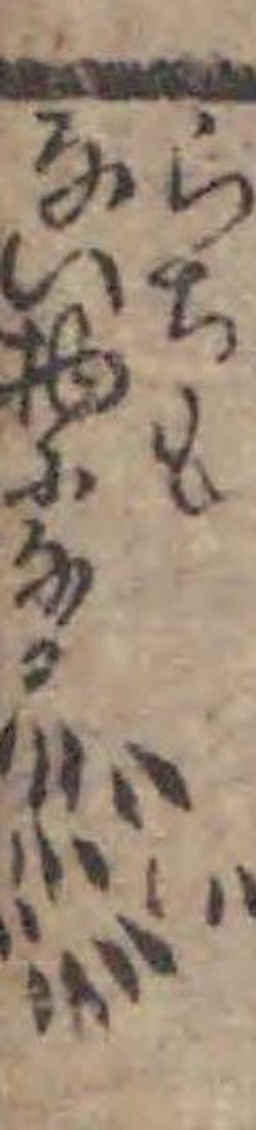ない物になる
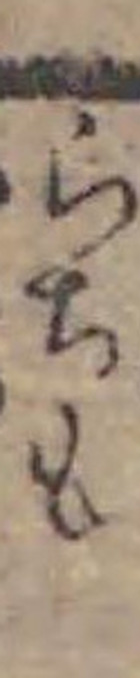らちも
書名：奇妙頂礼胎錫杖 : 3巻
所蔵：国立国会図書館 National Diet Library, JAPAN
